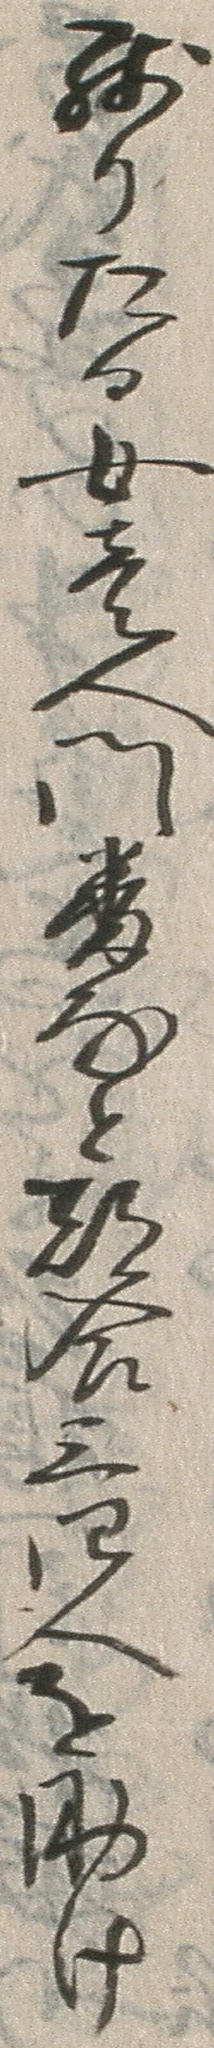残りたる女壱人門番なと都合三四人を助け
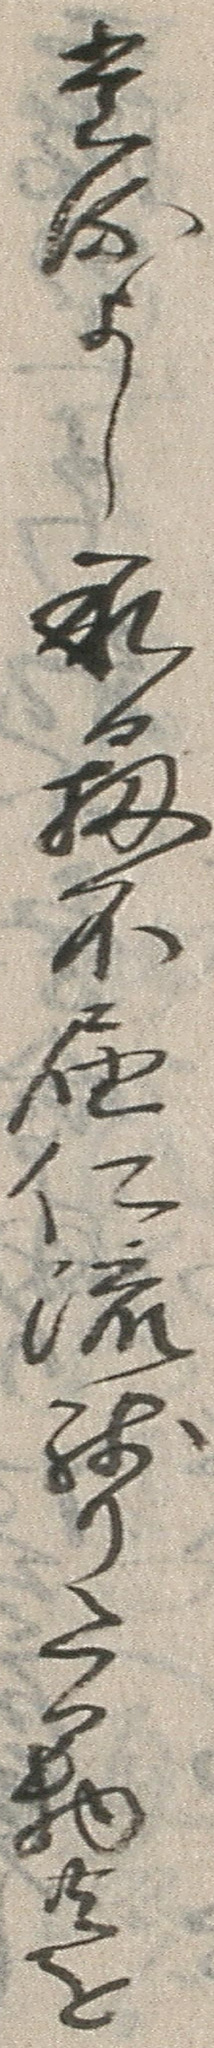たるよし承る扨不届仁流残りたる物共を
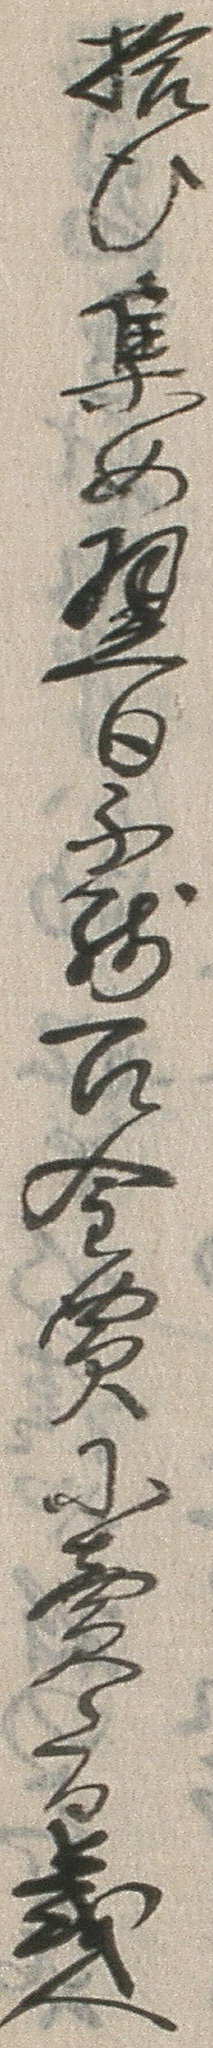拾ひ集め翌日不残百金買に売たる義人
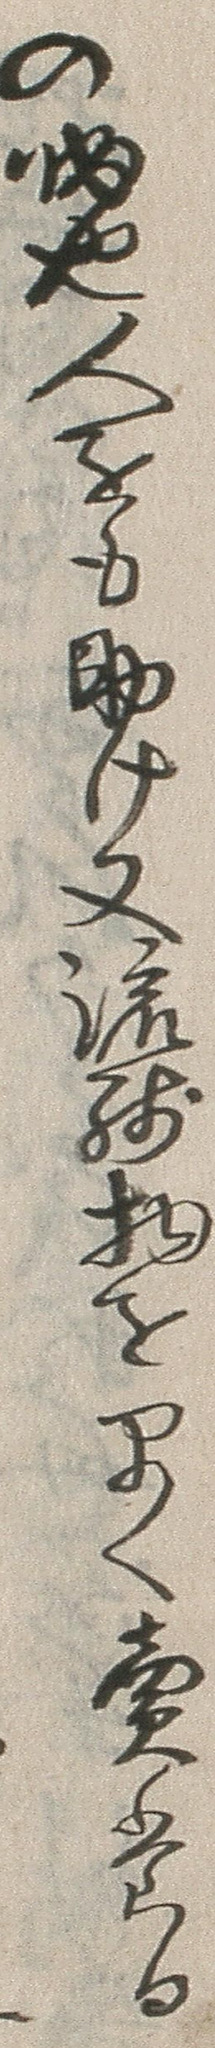の咄也人をも助け又流残物を早く売たる
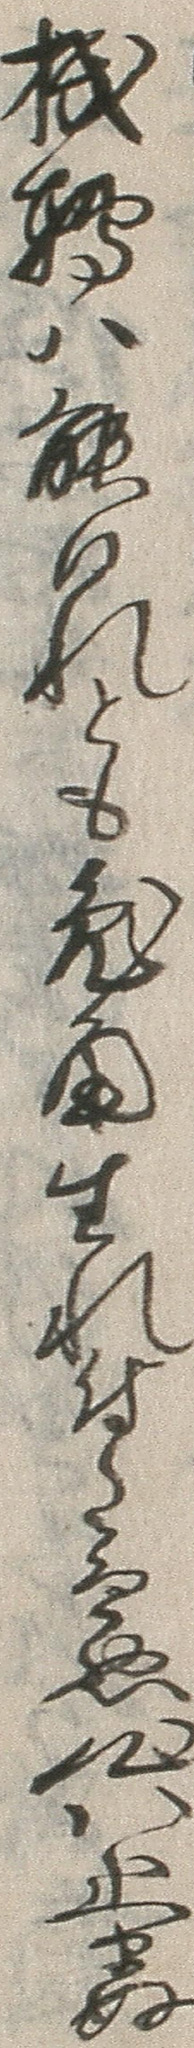機転は能かれとも兎角生れ付たる悪心は止まぬ
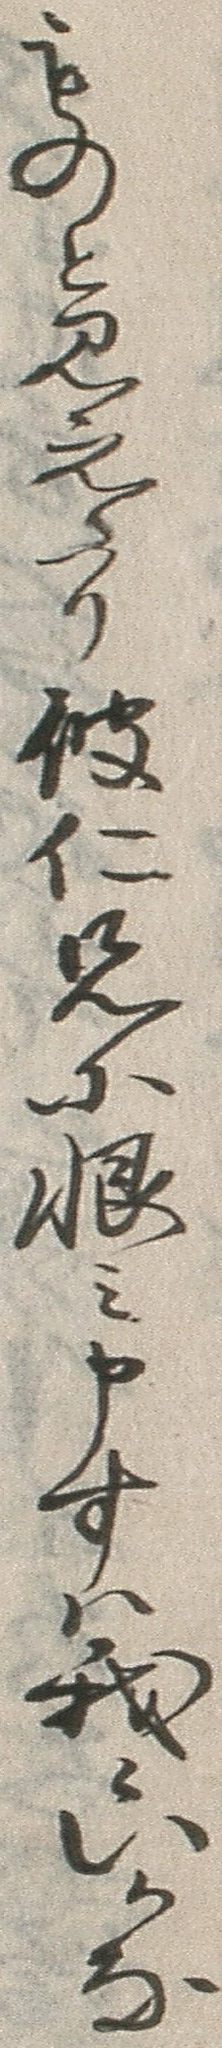ものと見えたり彼仁兄に恨み申すは我にいかな
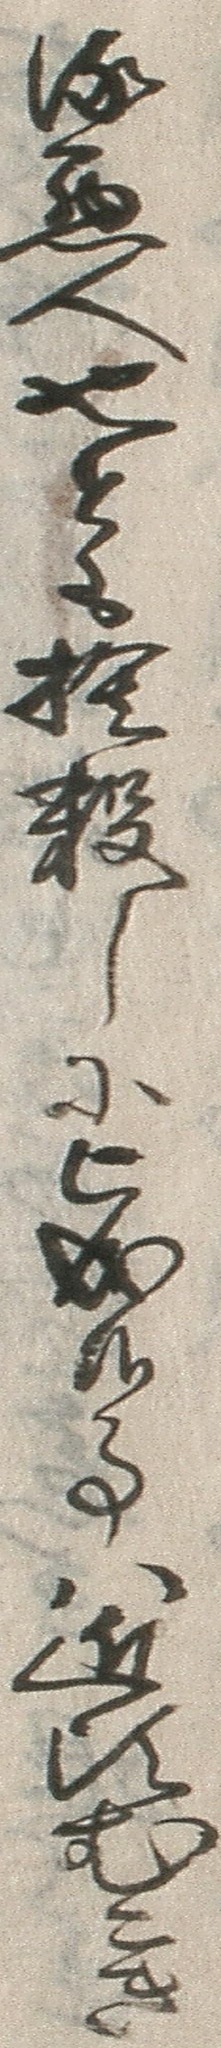る悪人也とも捨殺しに被成候事は近頃むこき
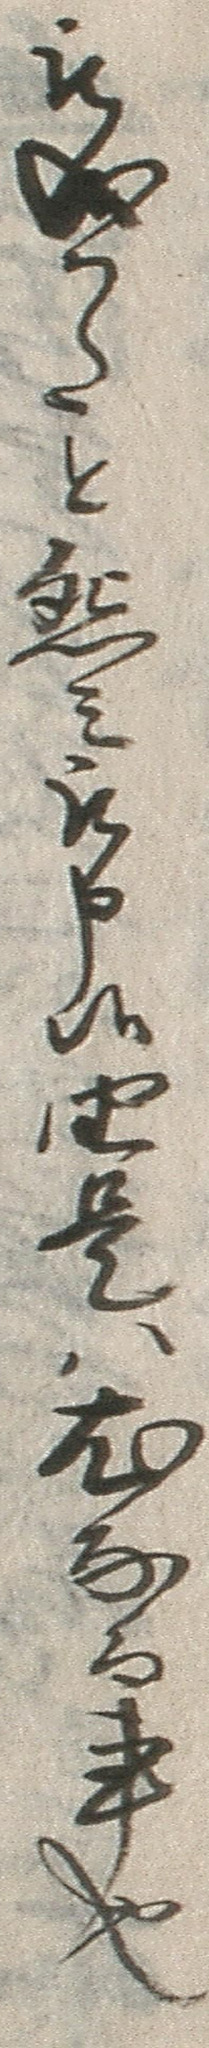被成かたと怨み被申候由是は尤なる事也
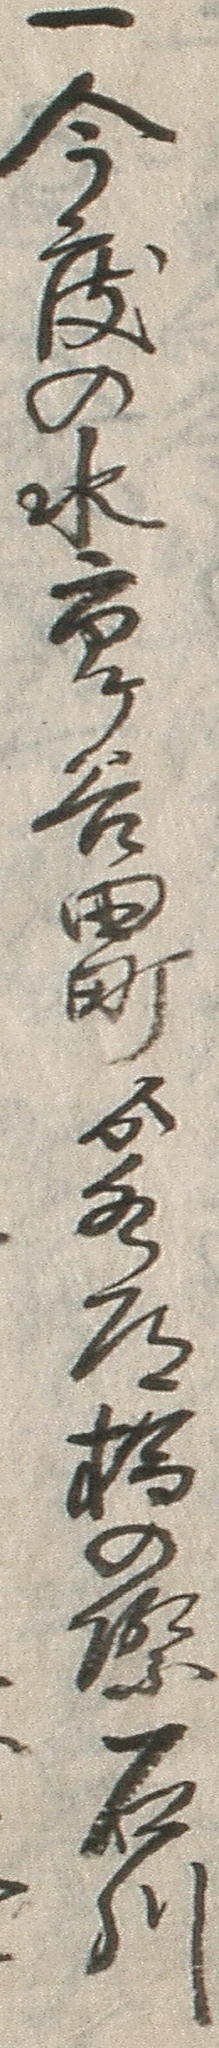一今度の水市ヶ谷田町ゟ水道橋の際石川
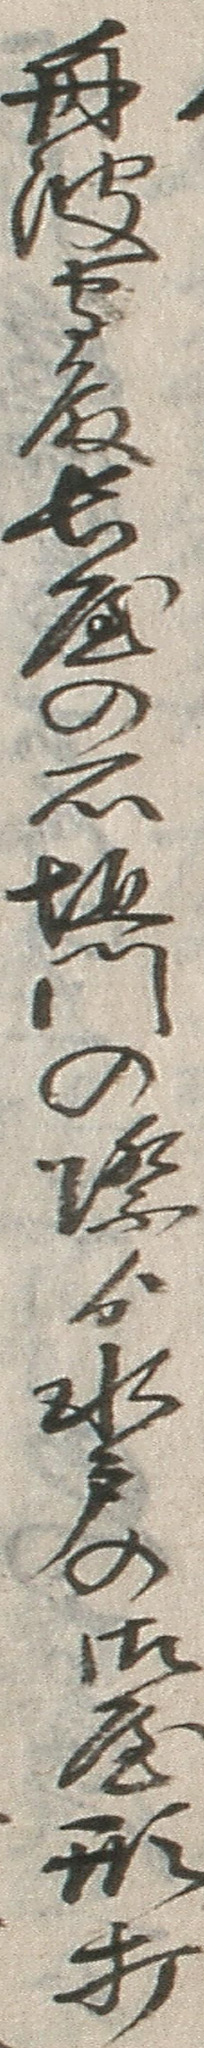丹波守殿長屋の石垣門の際ゟ水戸の御屋形打
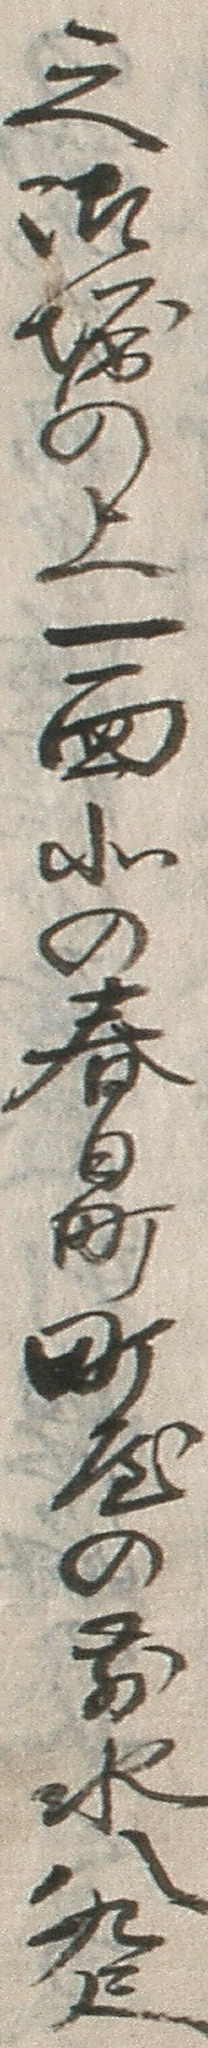之御堀の上一面北の春日町町家の前水八九尺
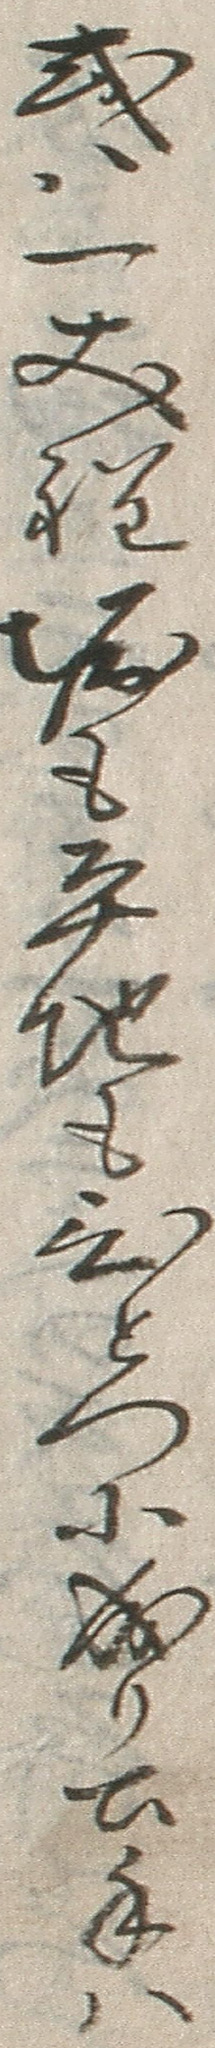或は一丈程堀も平地もひとつに成り土手は

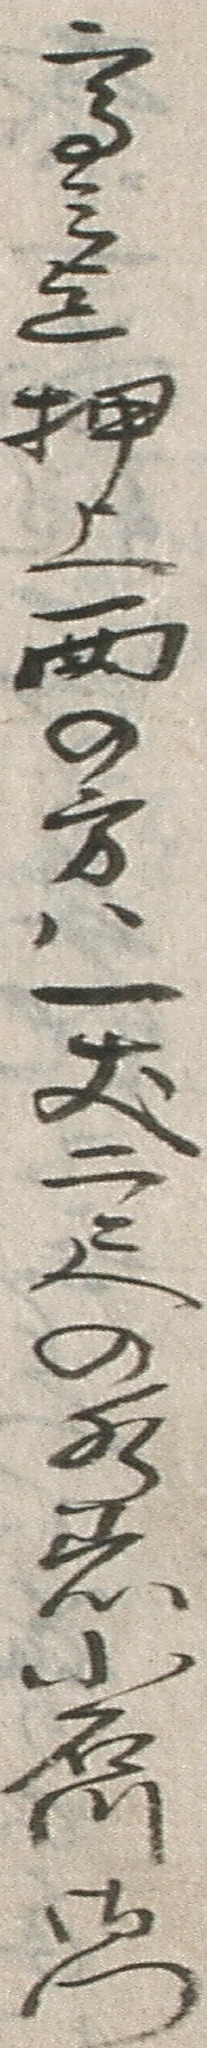高み迄押上西の方は一丈二尺の水着小石川御門
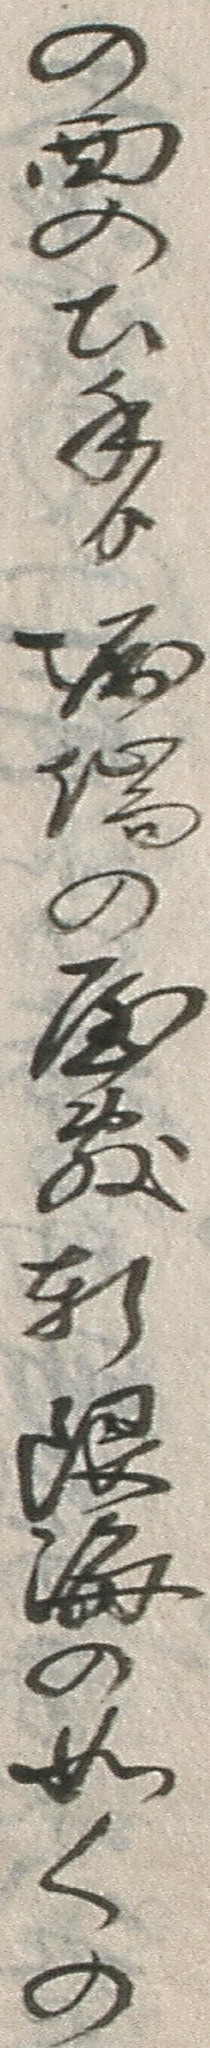の西の土手ゟ堀端の屋敷軒限海の如くの
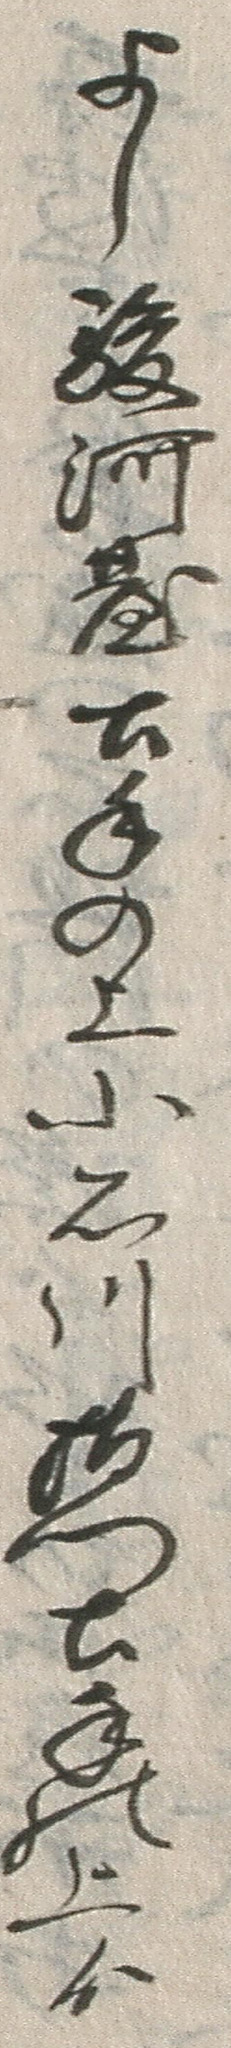よし駿河台土手の上小石川御門土手の上ゟ
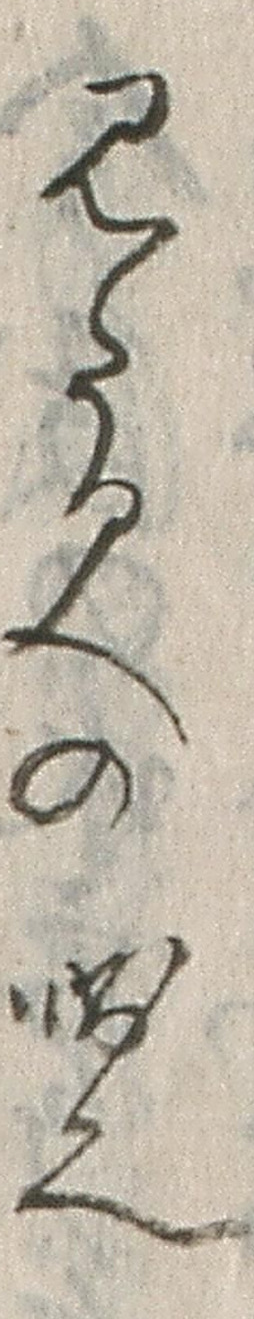見たる人の咄也
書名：享保十三年江戸洪水記
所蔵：東京大学地震研究所図書室 Earthquake Research Institute Library, The University of Tokyo, JAPAN
